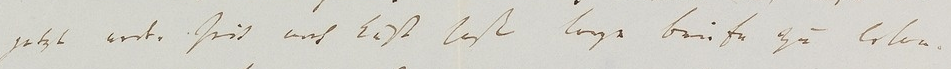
jetzt weder Zeit noch Lust hast lange Briefe zu lesen.
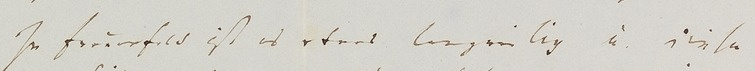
In Frauenfeld ist es etwas langweilig u. diese
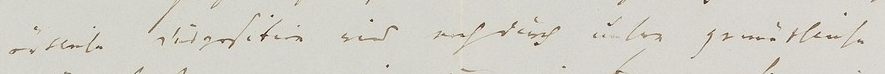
örtliche Disposition wird noch durch unsre gemüthliche
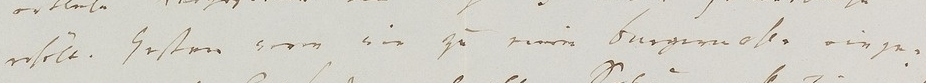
erhöht. Gestern waren wir zu einem Burgermahle einge-
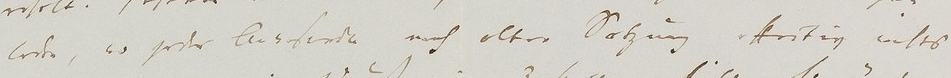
laden, wo jeder Anwesende nach alter Satzung effectiv nichts
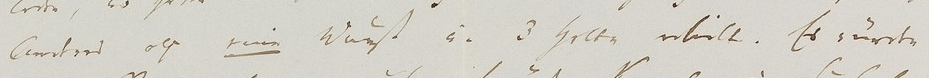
Andres als eine Wurst u. 3 Halbe erhielt. Es wurden
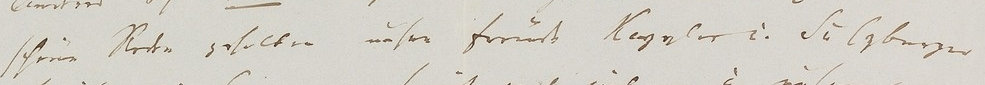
schöne Reden gehalten unsre Freunde Kappler u. Sulzberger
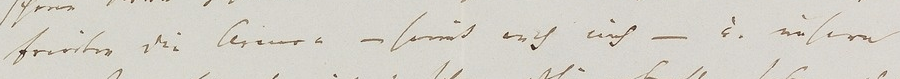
feierten die Armee – somit auch mich – u. unsern
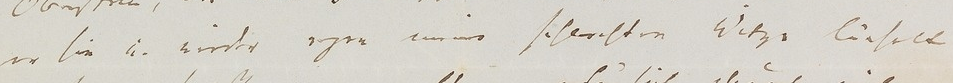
er hin u. wieder wegen meiner schlechten Witze lächelt
